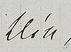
sein,
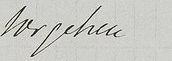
vorgehen
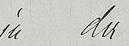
in der
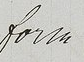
Form nur
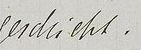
geschieht.
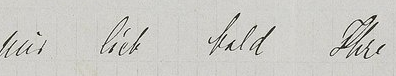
mir lieb bald Ihre
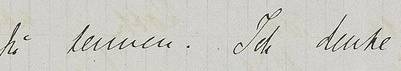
zu kennen. Ich denke
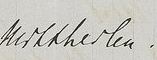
selbe wohl telegr.
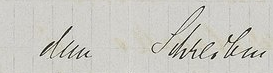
dem Schreiben
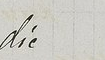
die
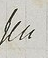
der
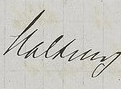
Haltung
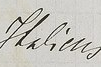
Italiens
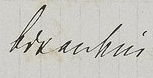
scheint
